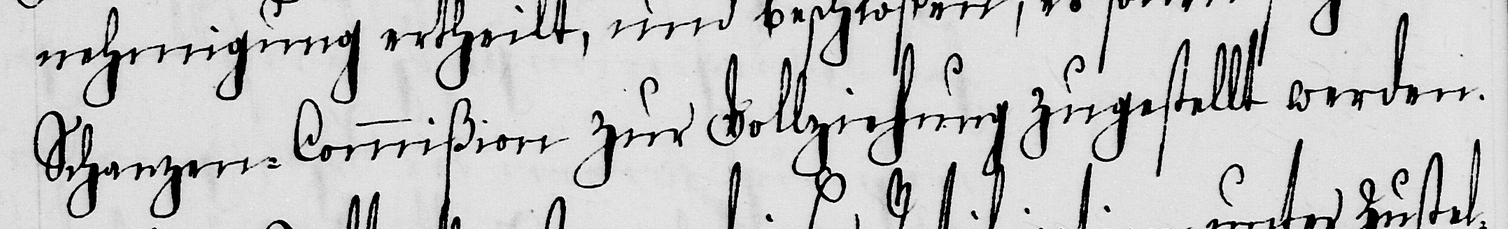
Schanzen-Commißion zur Vollziehung zugestellt werden.
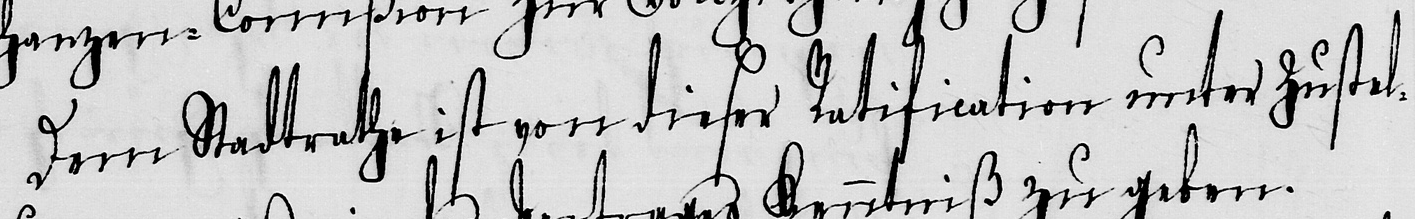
Dem Stadtrathe ist von dieser Ratification unter Zuste¬
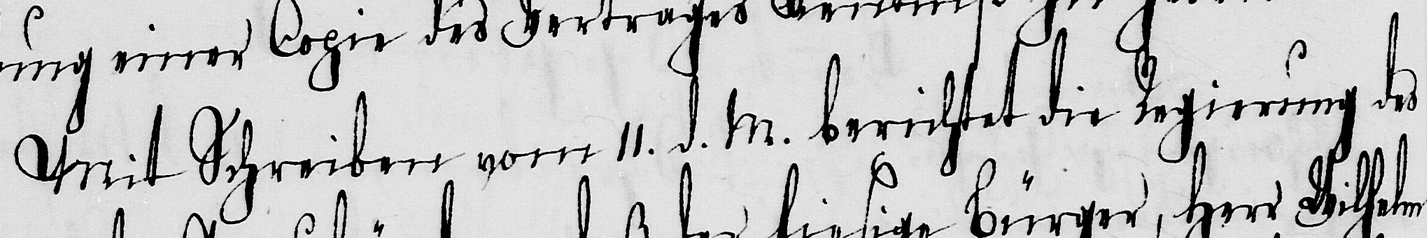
Mit Schreiben vom 11. d. M. berichtet die Regierung des
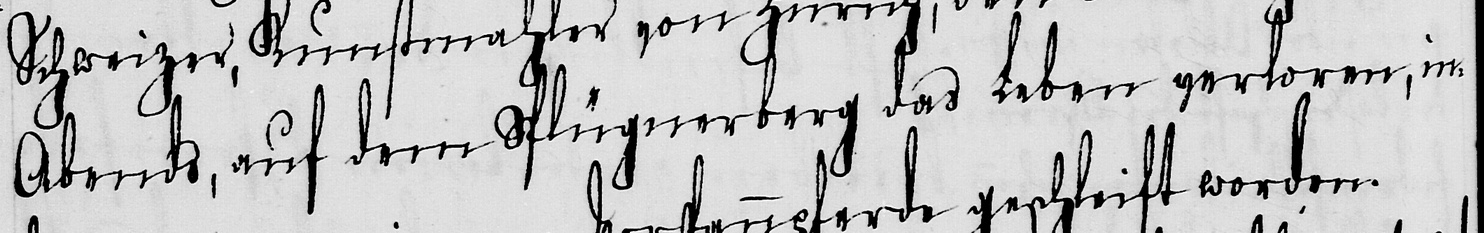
Abends, auf dem Splügnerberg das Leben verloren, in¬
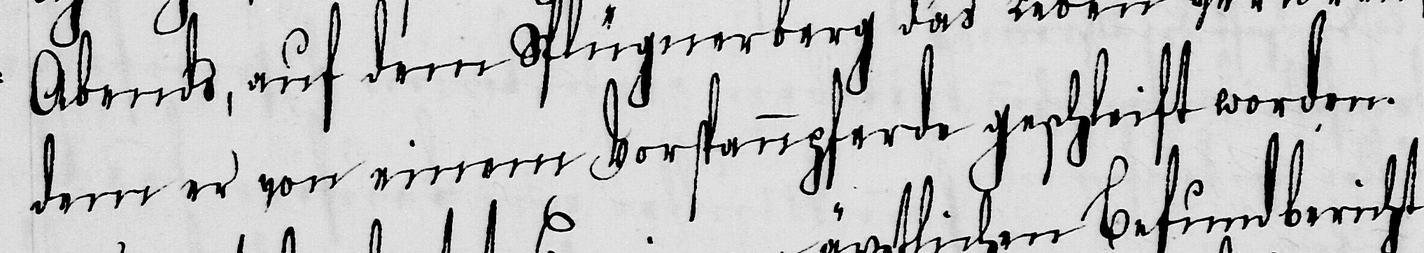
dem er von einem Vorspannpferde geschleift worden.
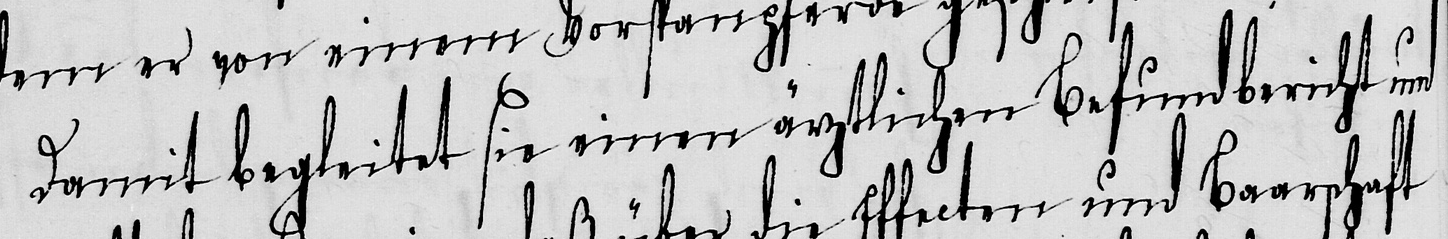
Damit begleitet sie einen ärztlichen Befundbericht
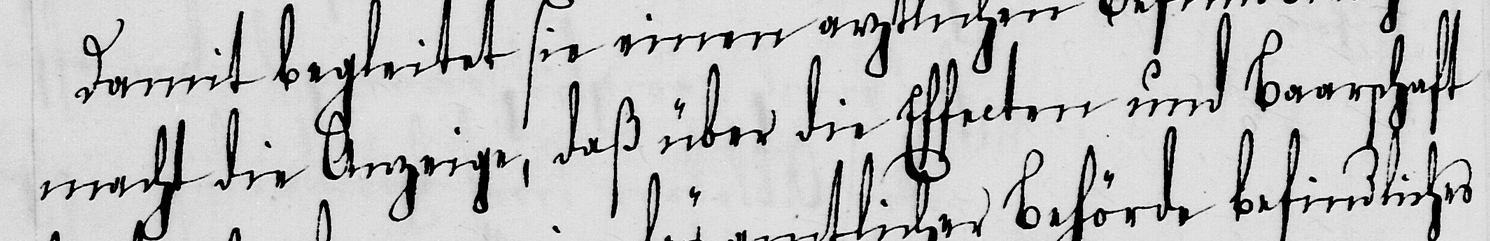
macht die Anzeige, daß über die Effecten und Baarscha¬
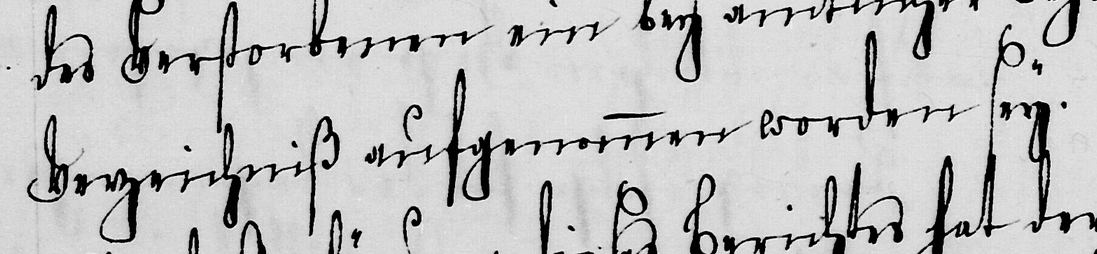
Verzeichniß aufgenommen worden sey.
